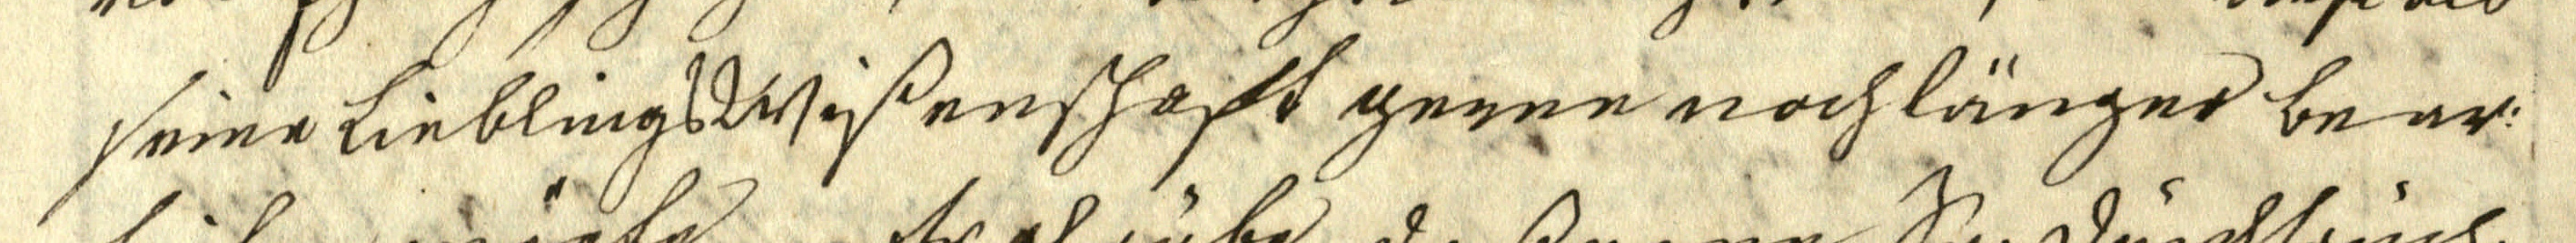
seine Lieblings Wißenschaft gerne noch länger bear¬
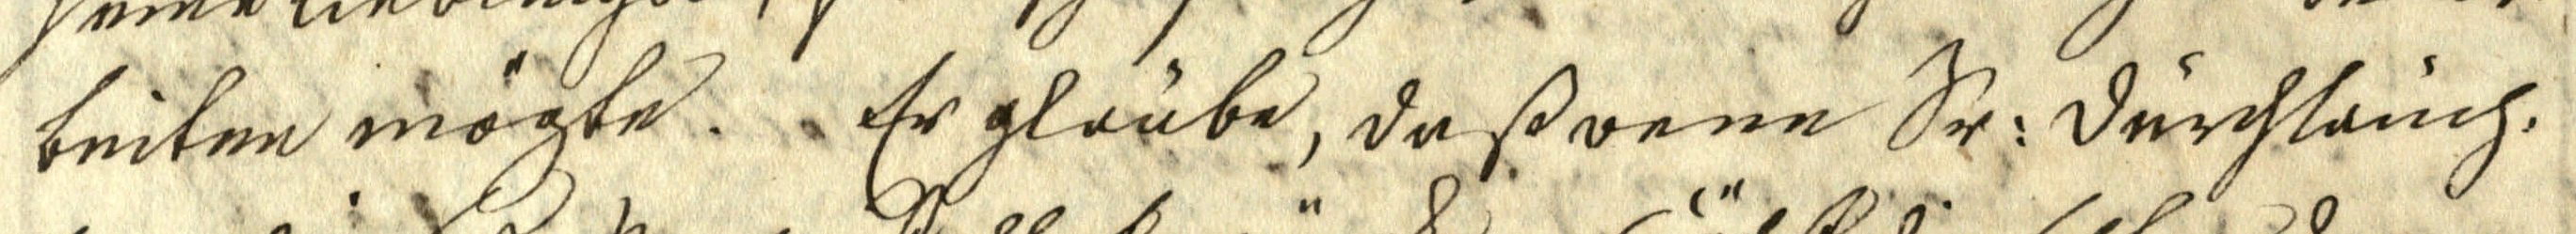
beiten mögte. Er glaube, daß wenn Sr Durchlauch¬
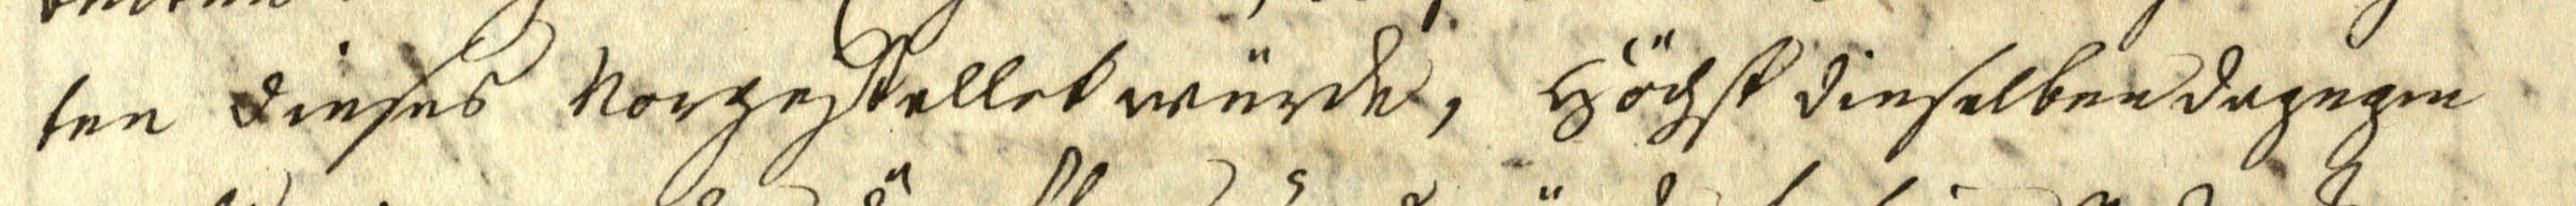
ten dieses vorgestellet würde, Höchst dieselben dagegen
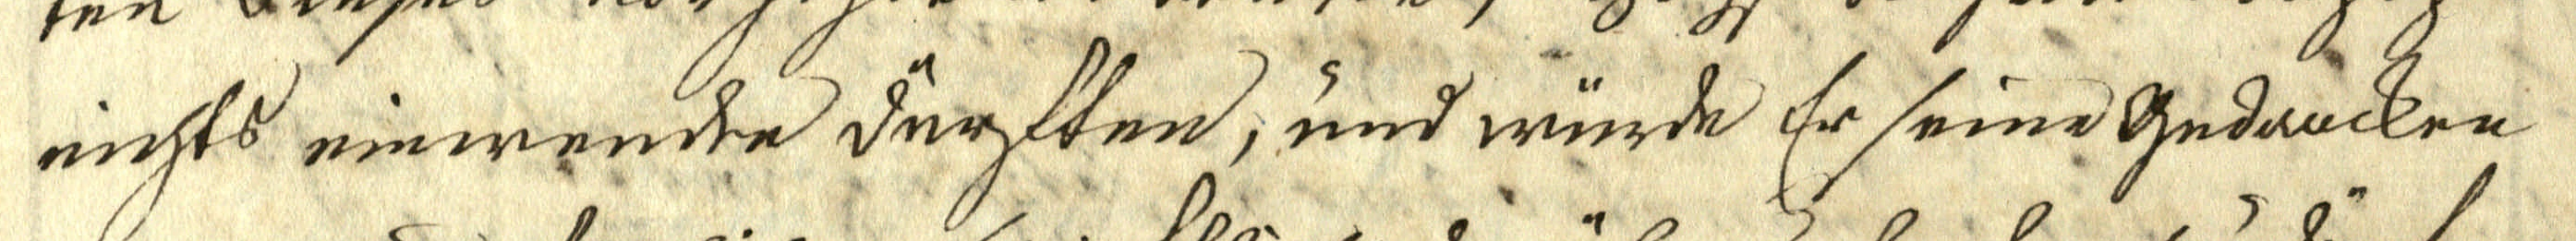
nichts einwenden dürften, und würde Er seine Gedancken
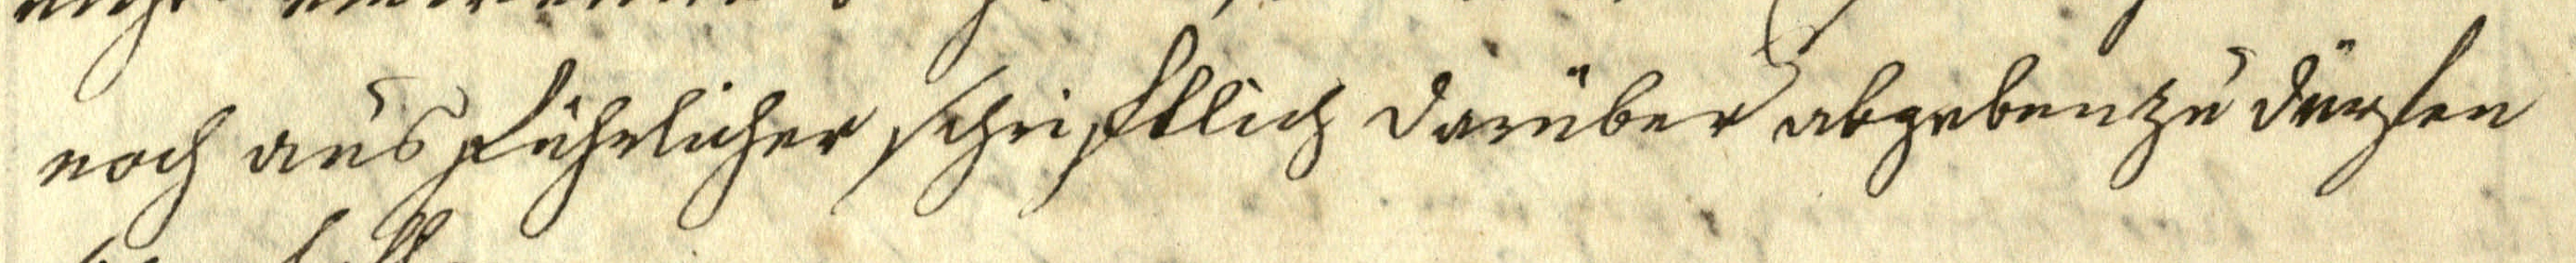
noch ausführlicher schriftlich darüber abgeben zu dürfen
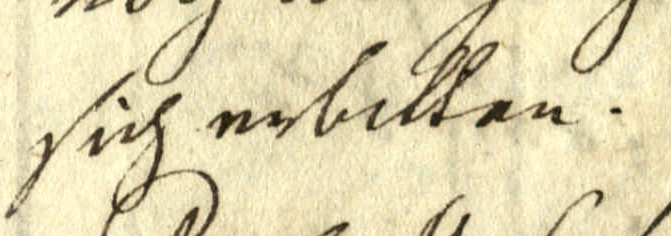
sich erbitten.
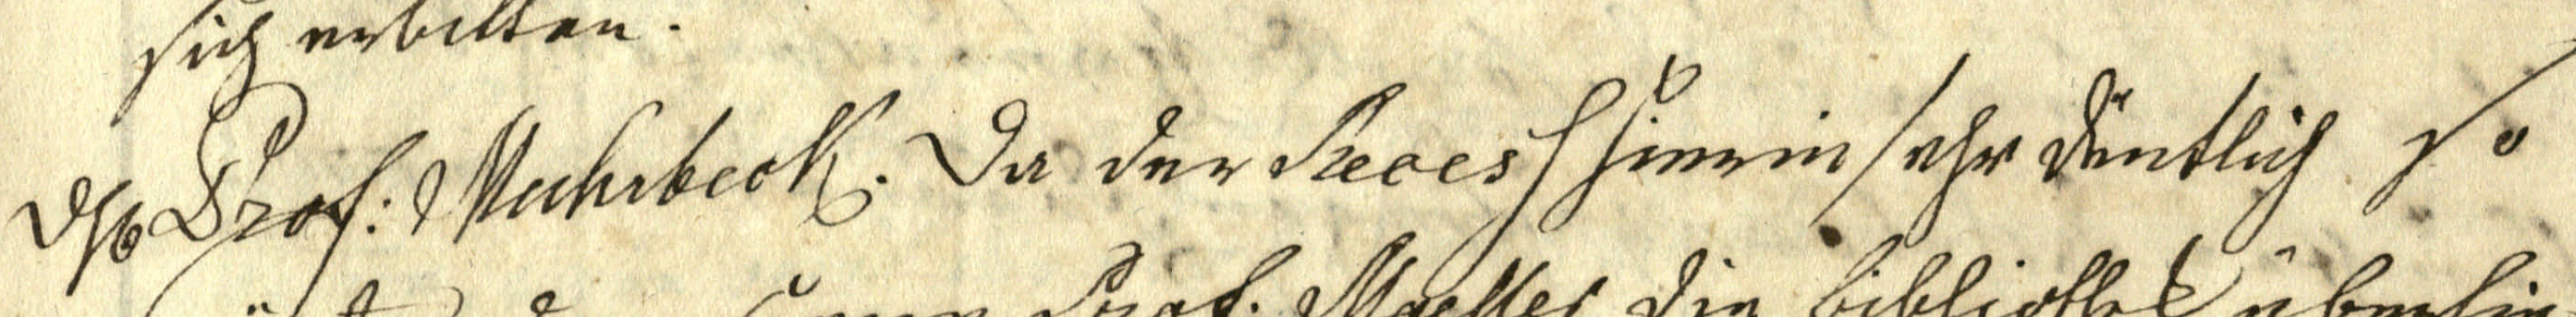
dh. Prof. Muhrbeck. Da der Recess hierin sehr deutlich so
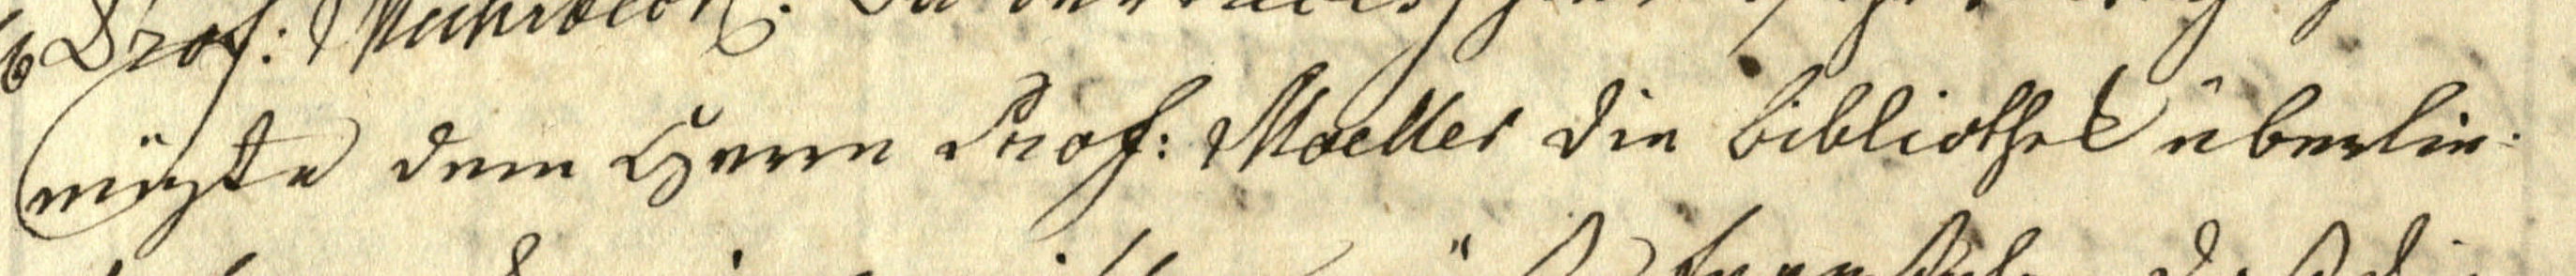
müste dem Herrn Prof. Moeller die Bibliothek überlie¬
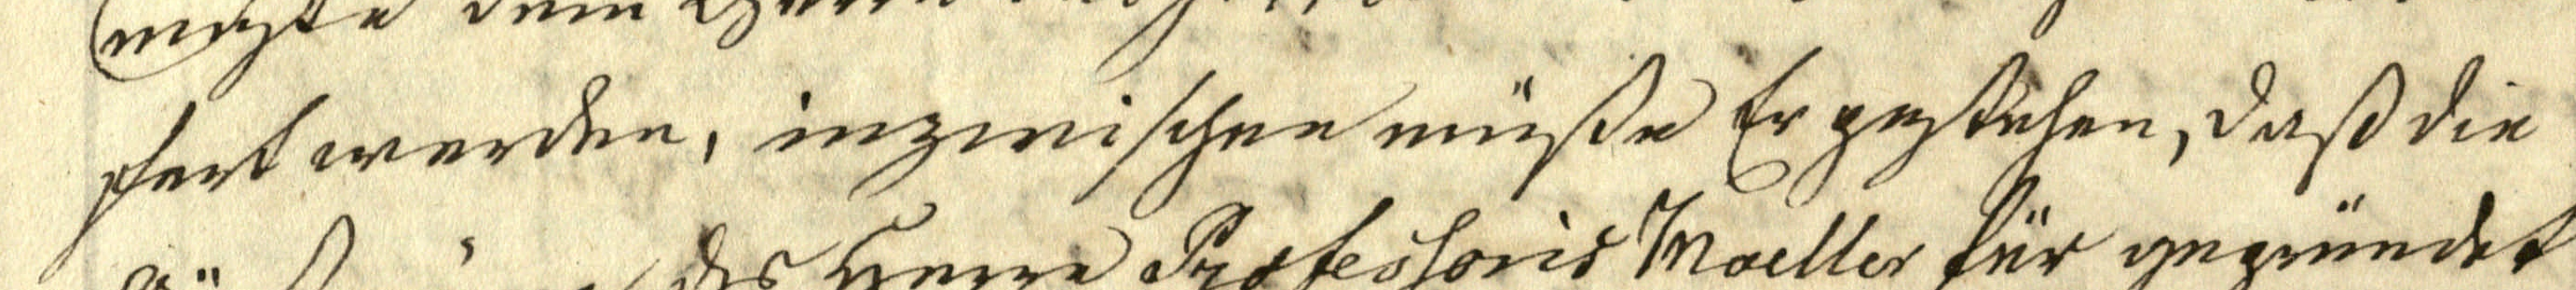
fert werden, inzwischen müße Er gestehen, daß die
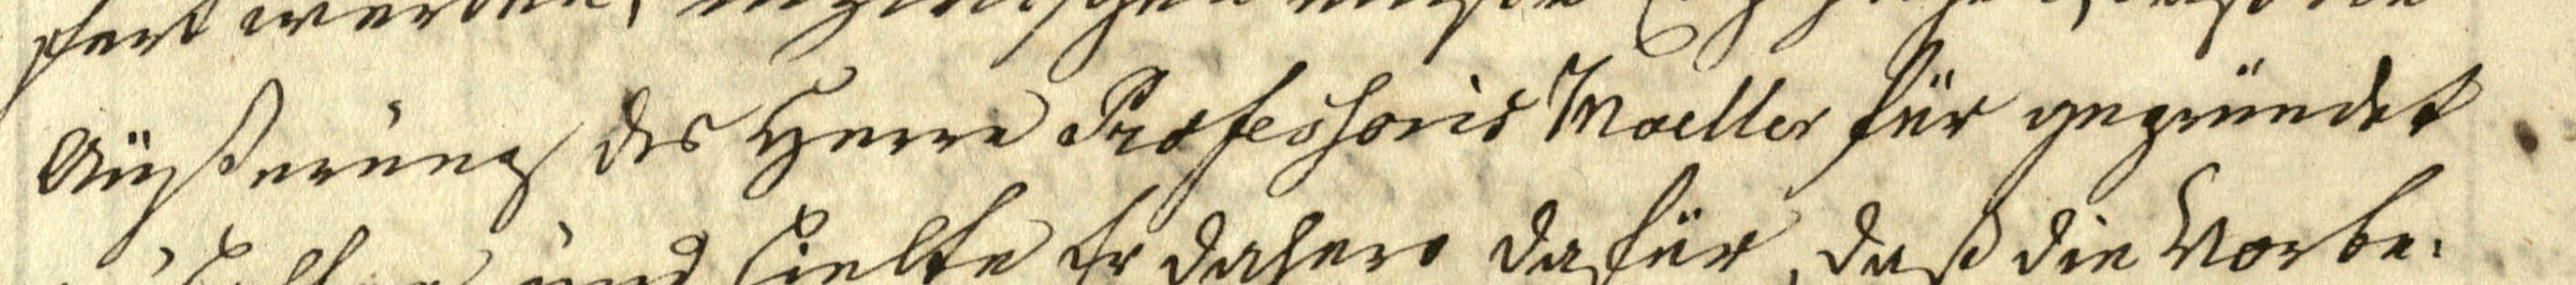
Äußerung des Herrn Professoris Moeller für gegründet
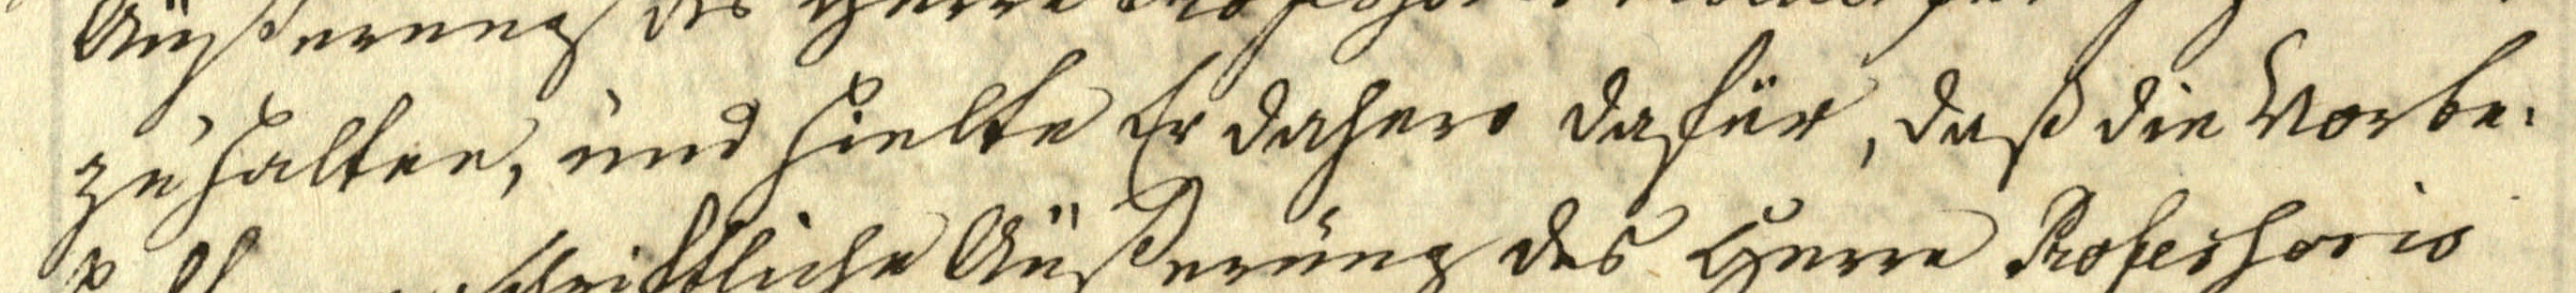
zu halten, und hielte Er dahero dafür daß die Vorbe¬
